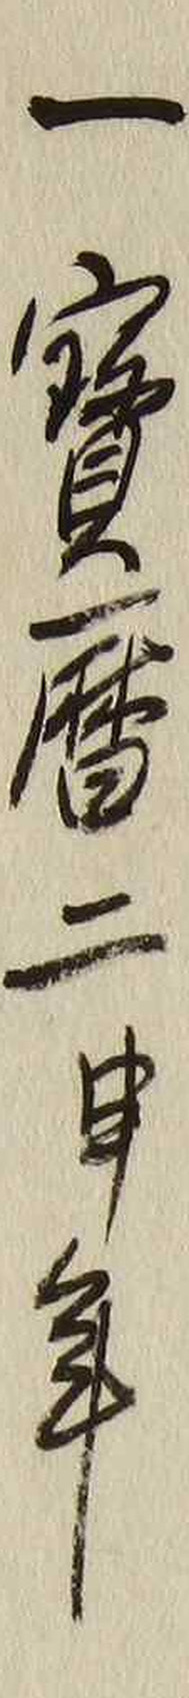一宝暦二申年
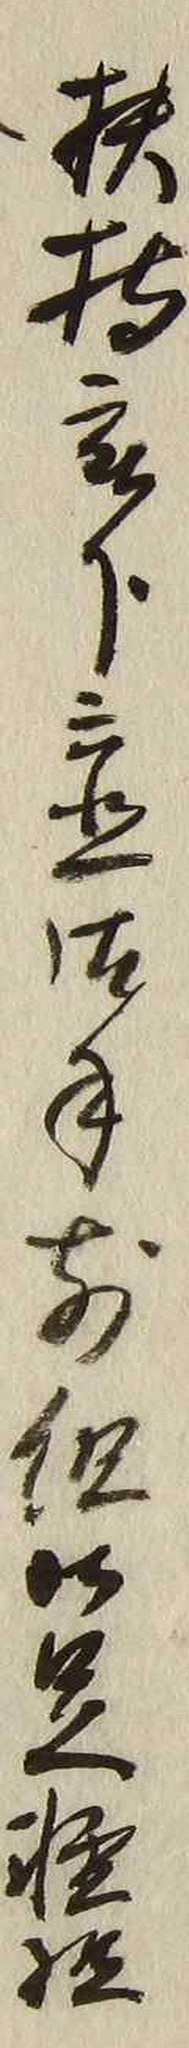扶持被下置御手前組御足軽組
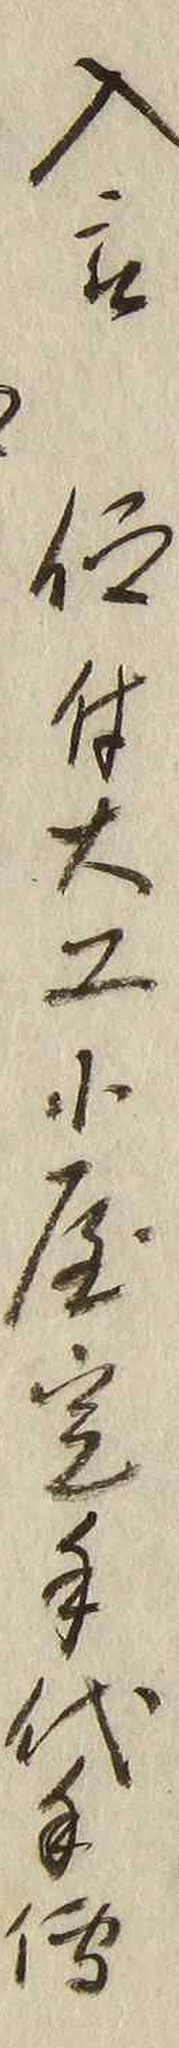入被仰付大工小屋定手代手伝
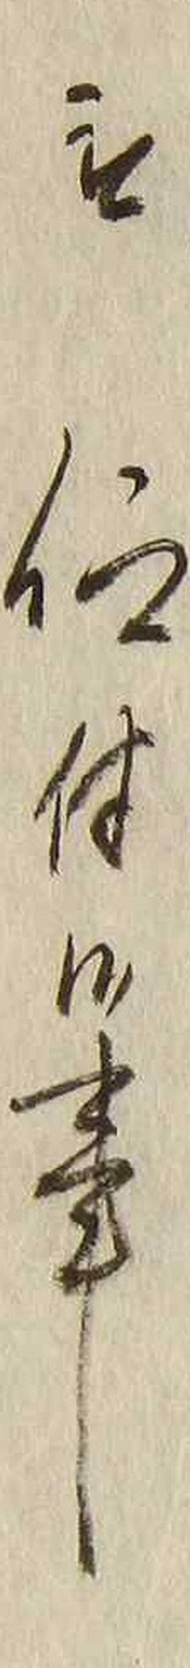被仰付候事

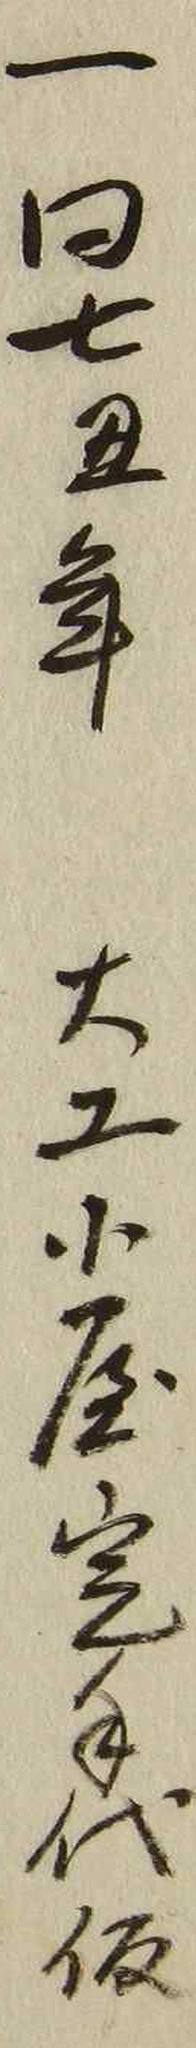一同七丑年大工小屋定手代仮
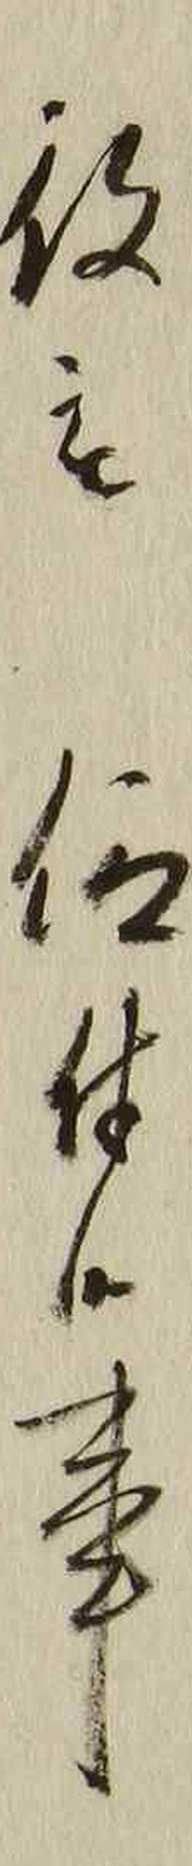役被仰付候事
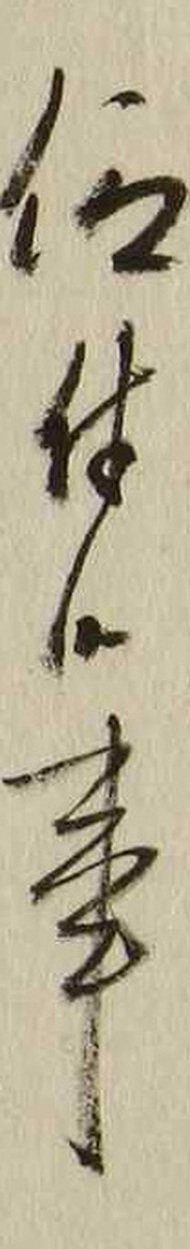仰付候事
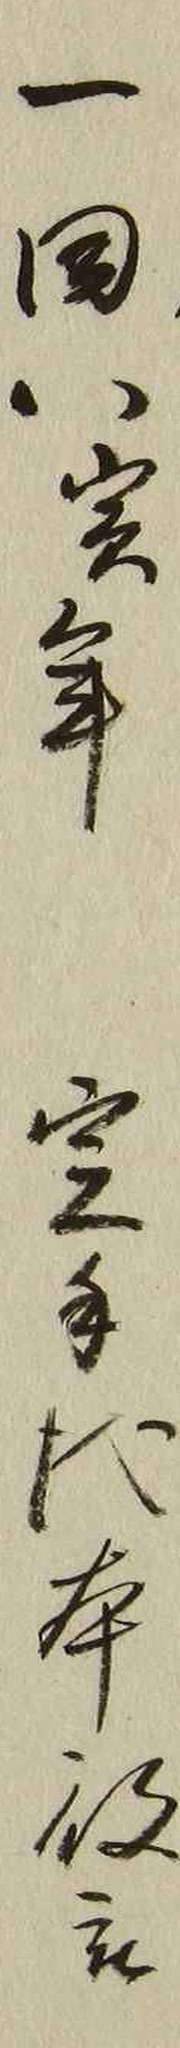一同八寅年定手代本役被
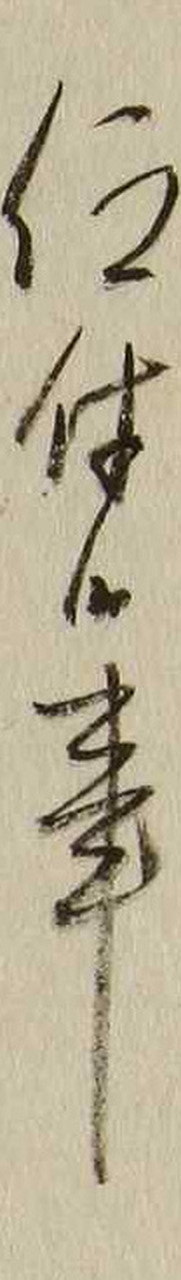仰付候事
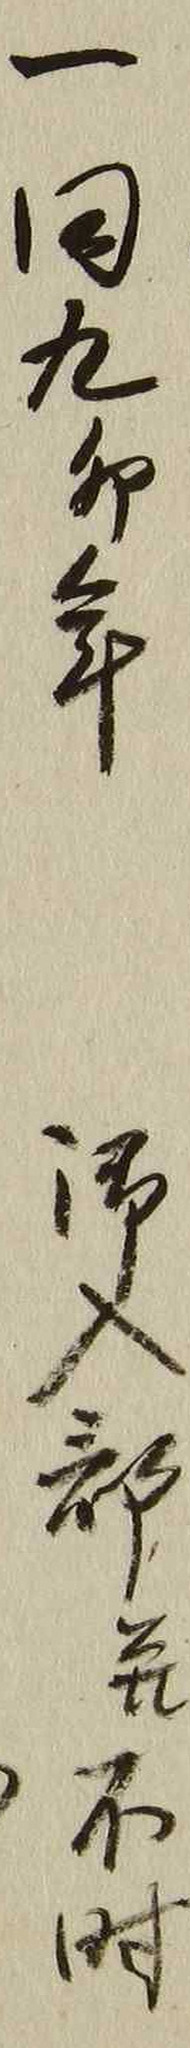一同九卯年御入部并不時
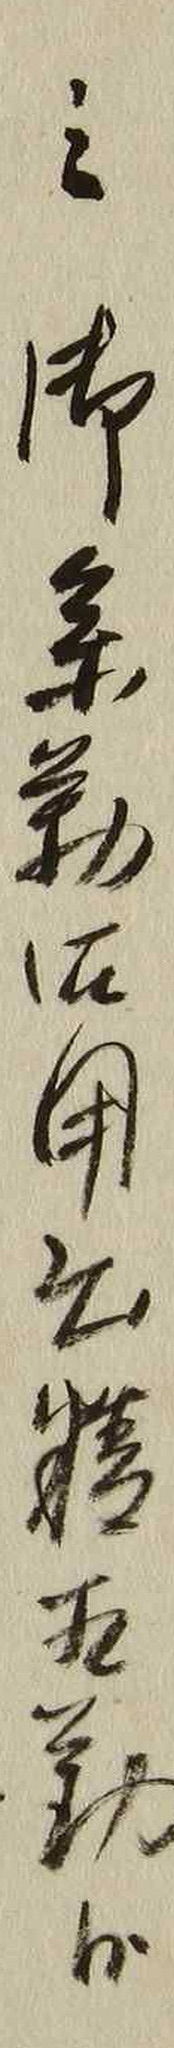之御参勤御用出精相勤候
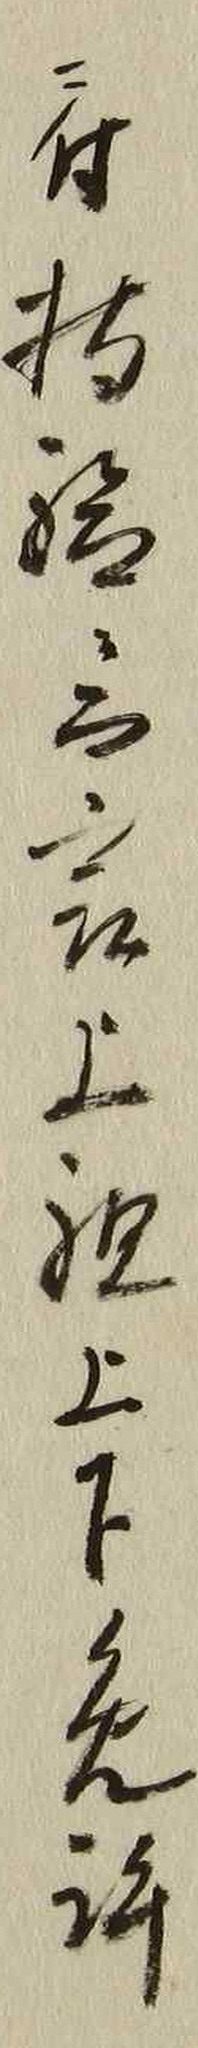ニ付持給ニ而最上組上下免許
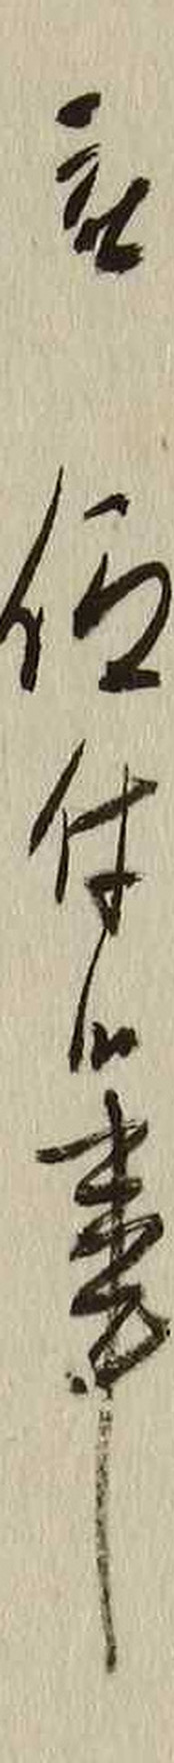被仰付候事
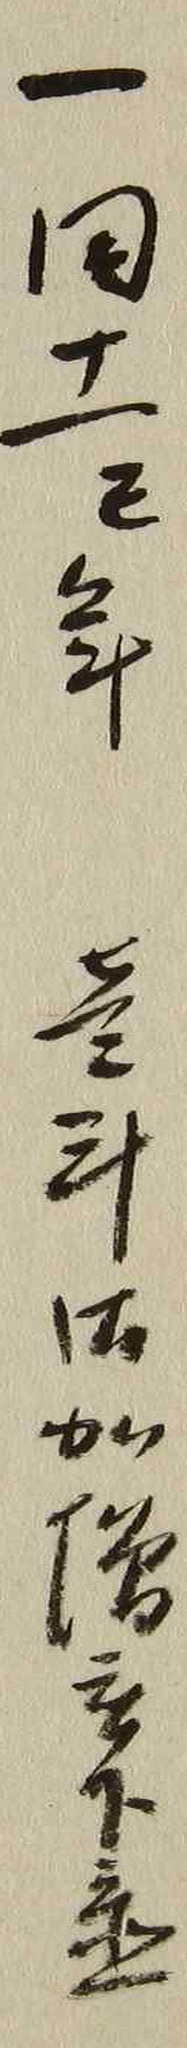一同十一巳年壱斗御加増被下置
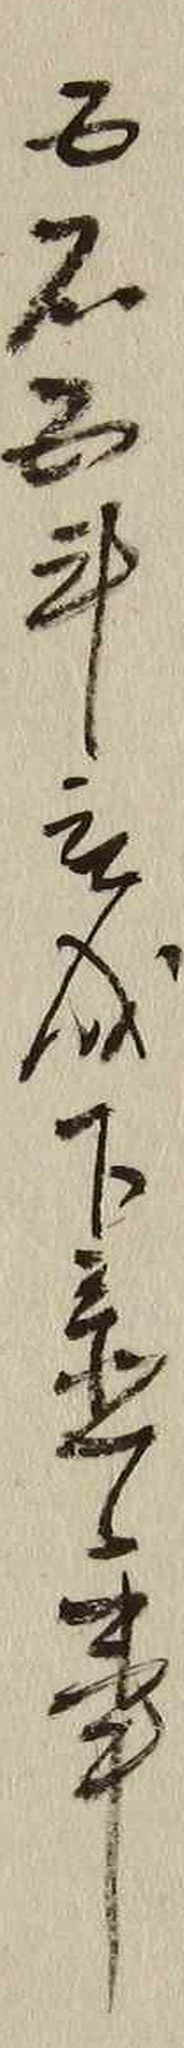五石五斗被成下置候事
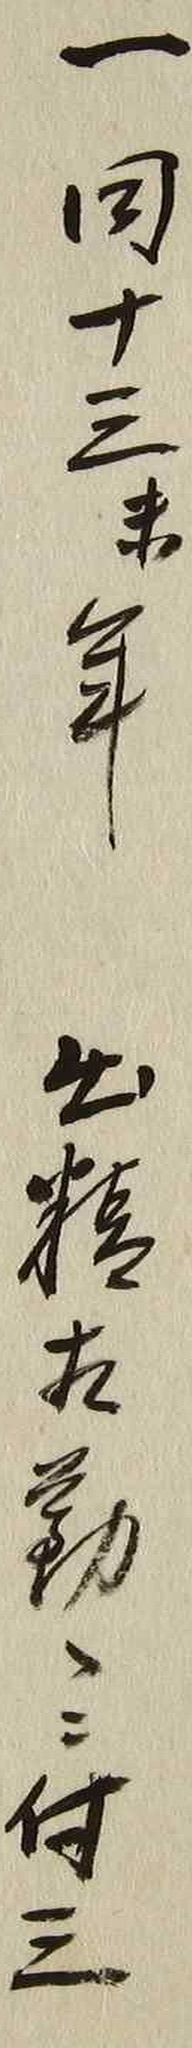一同十三未年出精相勤候ニ付三
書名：諸士系譜　巻之353　す之部3
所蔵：会津若松市立会津図書館
